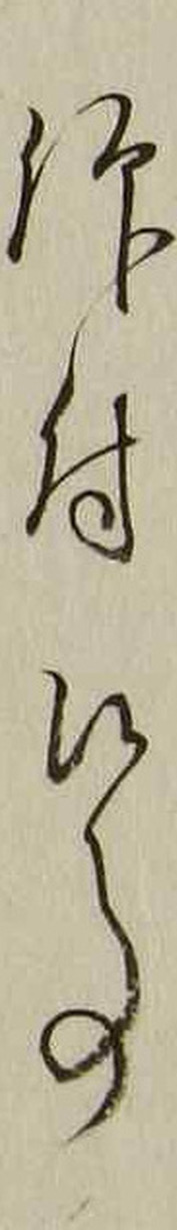仰付候事
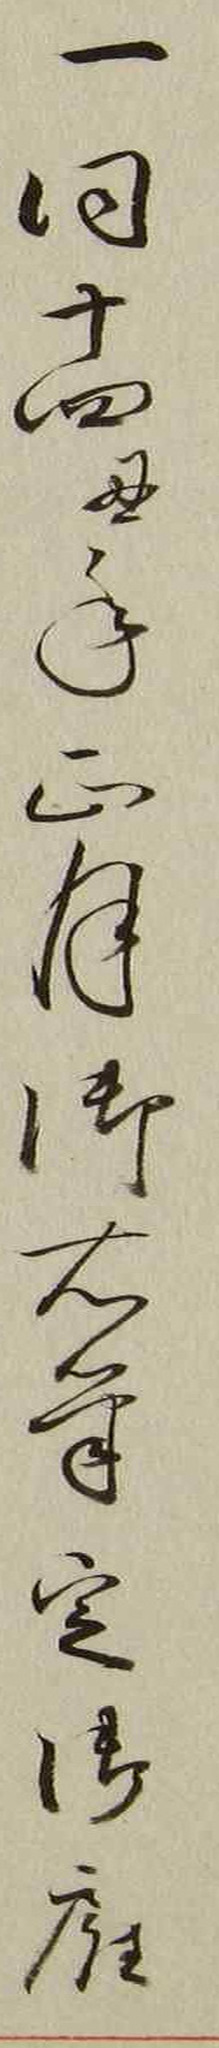一同十四丑年正月御右筆定御雇
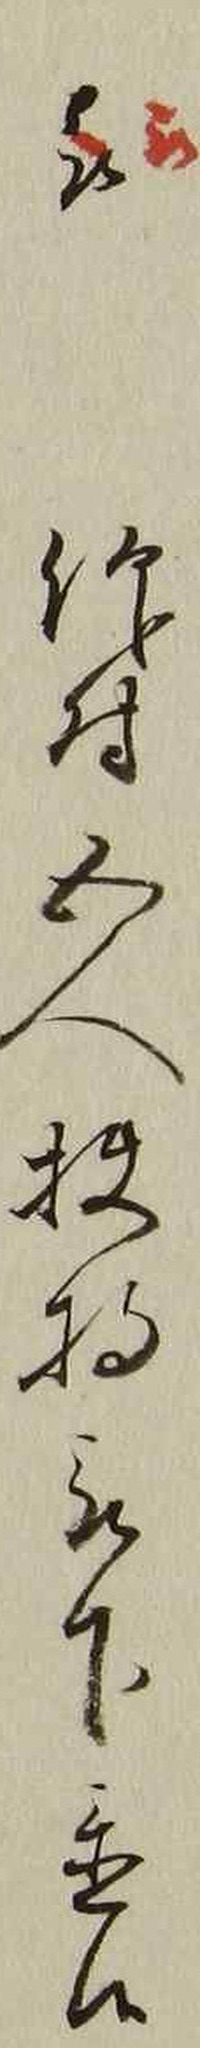被仰付五人扶持被下置候
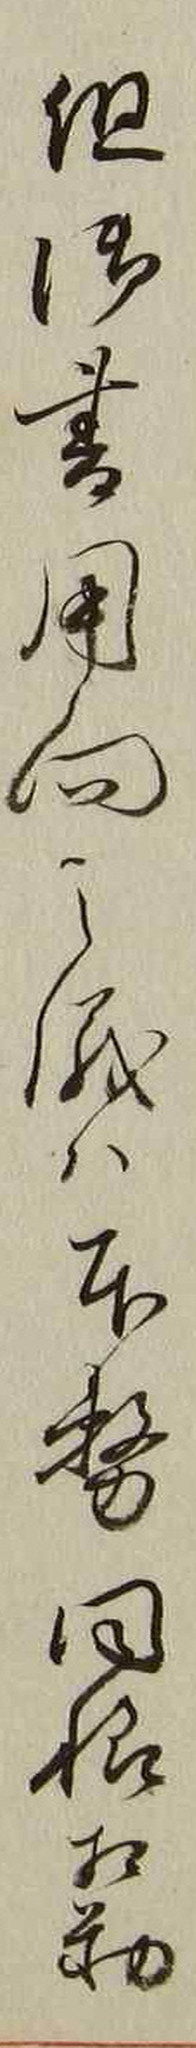但御書用向之儀ハ本務同様相勤
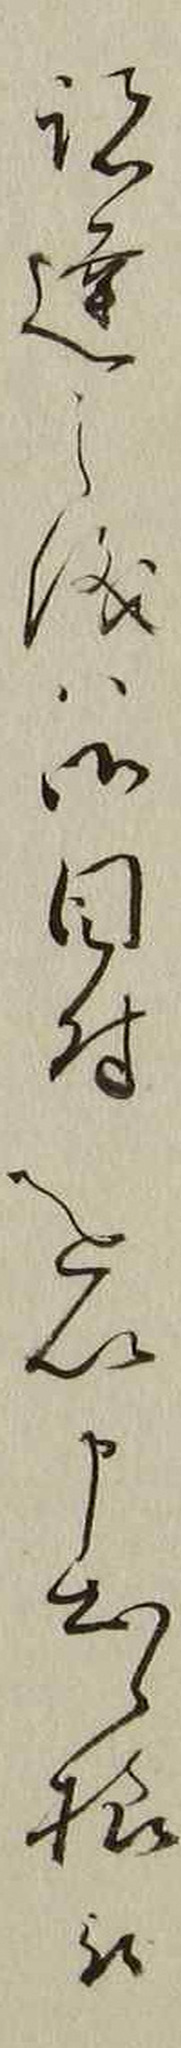諸達之儀ハ御目付を以申出候様被
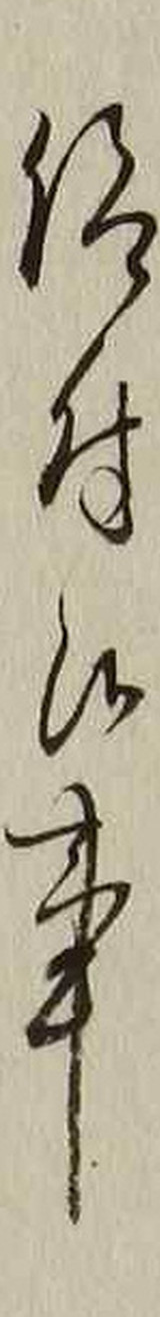仰付候事
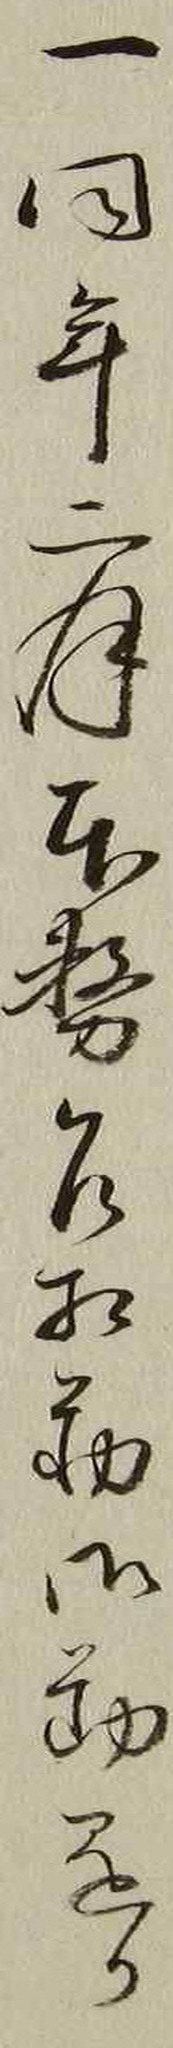一同年二月本務乍相勤御勤懸り
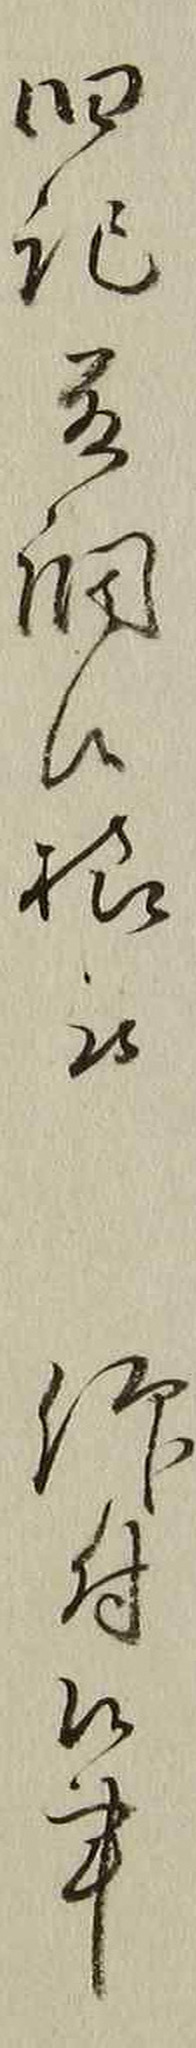旧記取調候様被仰付候事
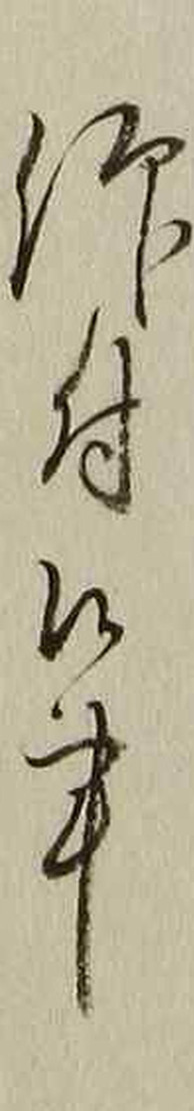仰付候事
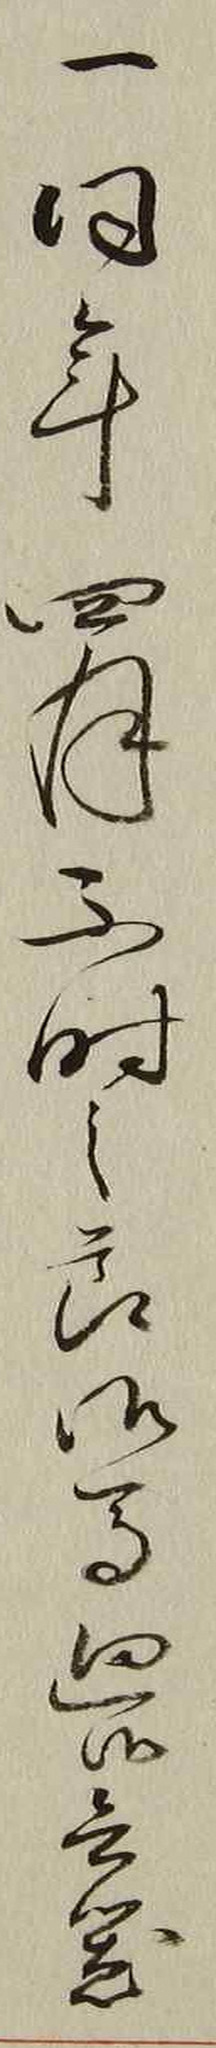一同年四月不時之節御馬廻御兵器
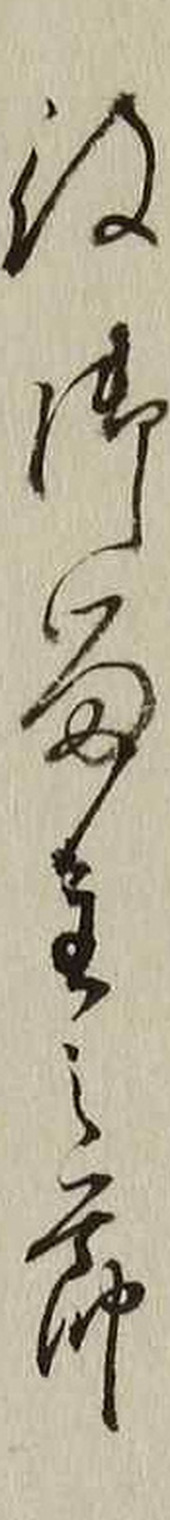役御留主之節
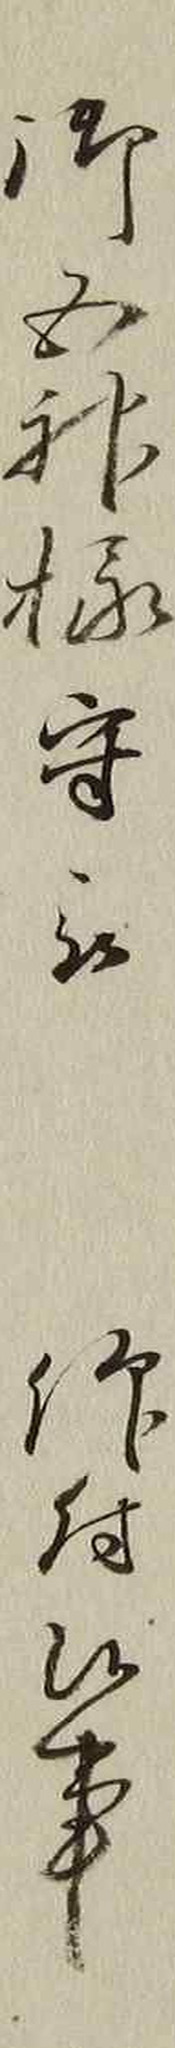御五神様守被仰付候事
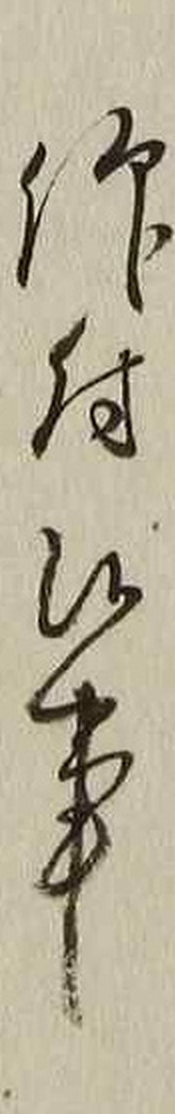仰付候事
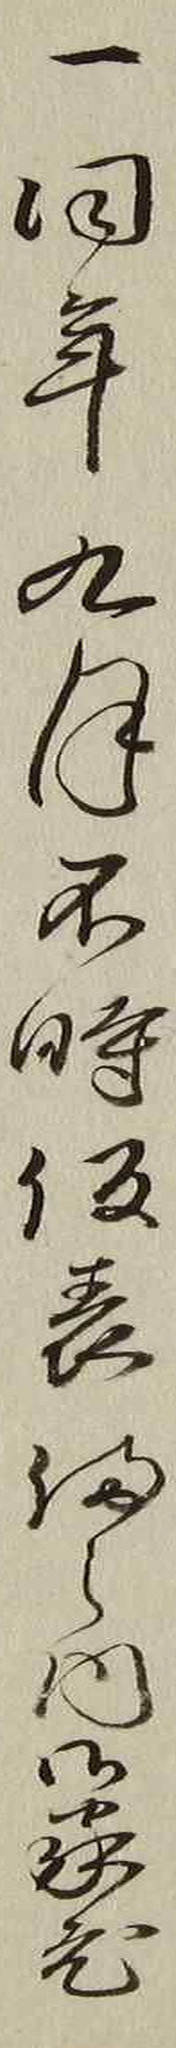一同年九月不時仮表備之内御家老
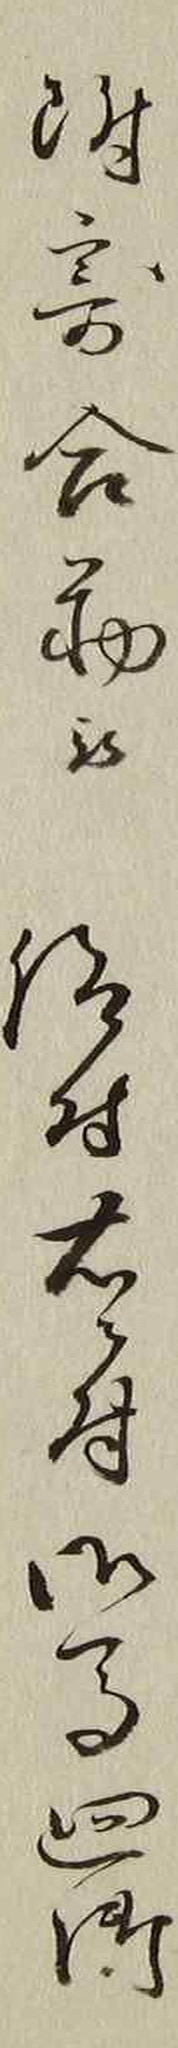附寄合勤被仰付右ニ付御馬廻御
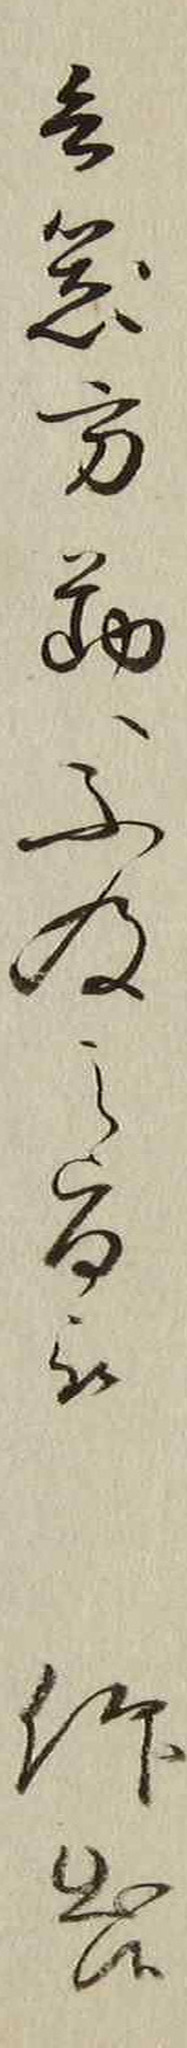兵器方勤へ不及之旨被仰出候
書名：諸士系譜　巻之4　い之部4
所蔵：会津若松市立会津図書館
